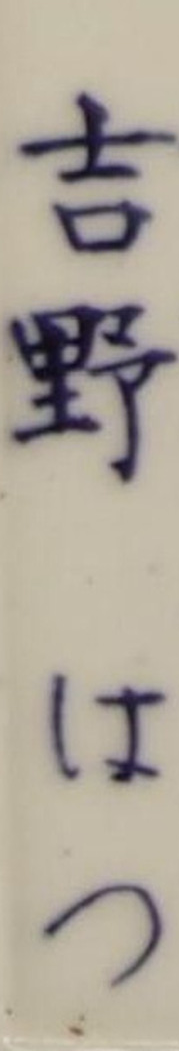吉野はつ

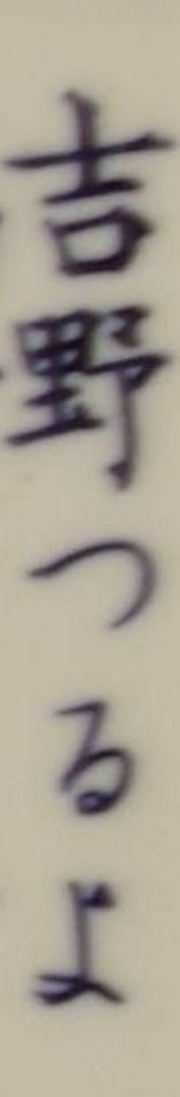吉野つるよ
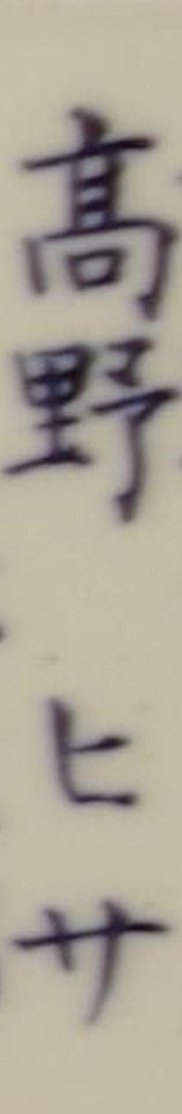高野ヒサ
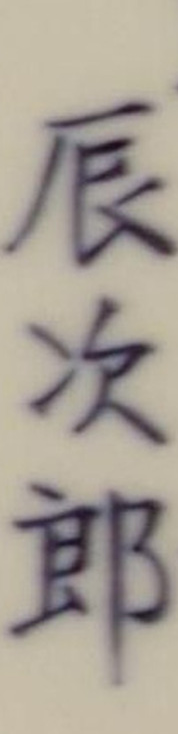辰次郎
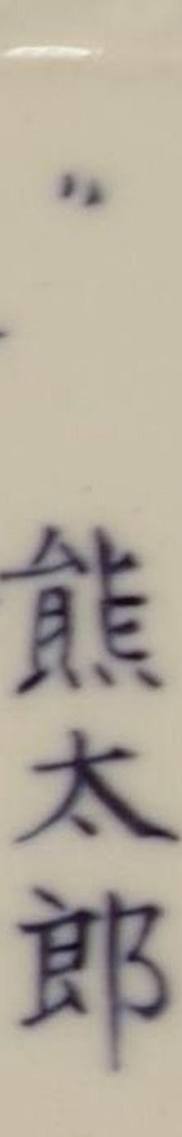熊太郎
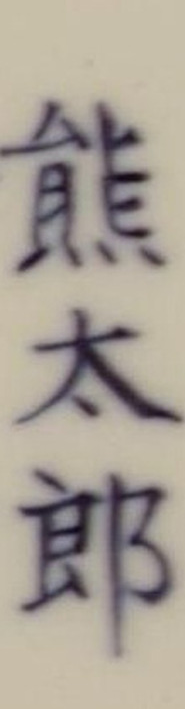熊太郎
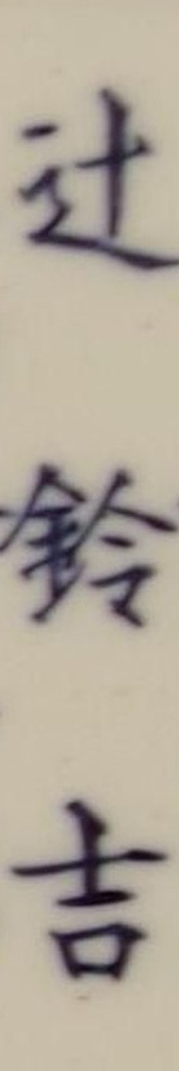辻鈴吉
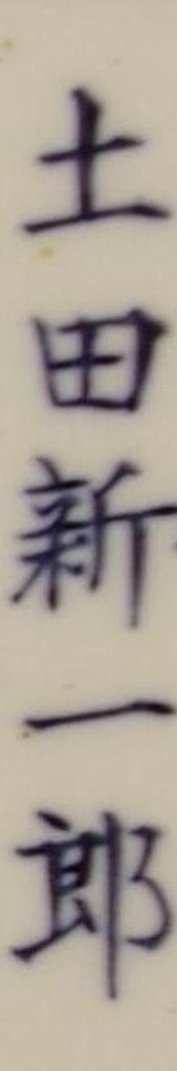土田新一郎
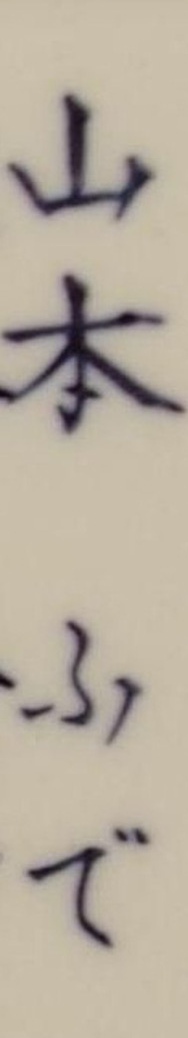山本ふで
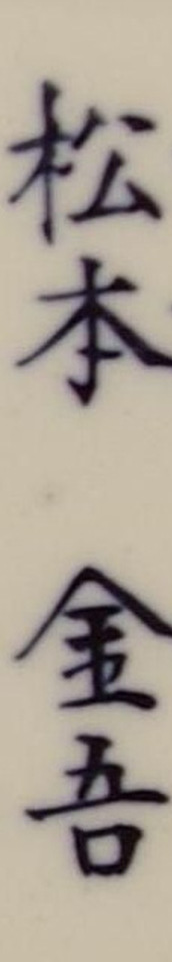松本金吾
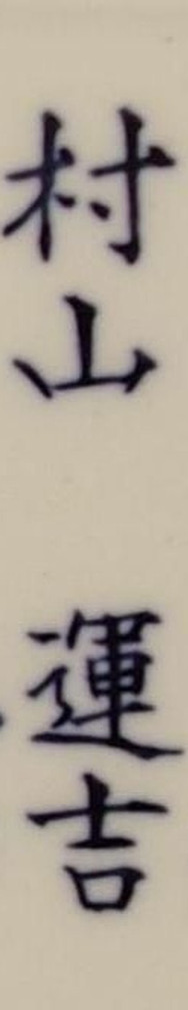村山運吉
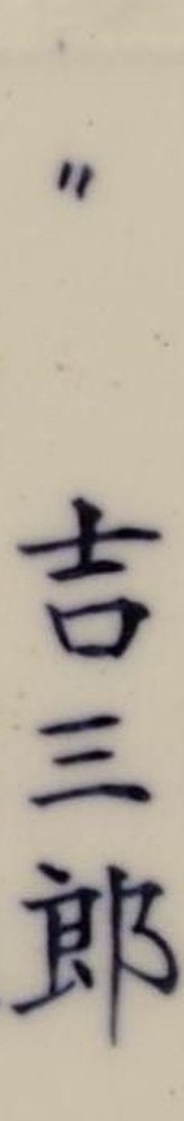吉三郎
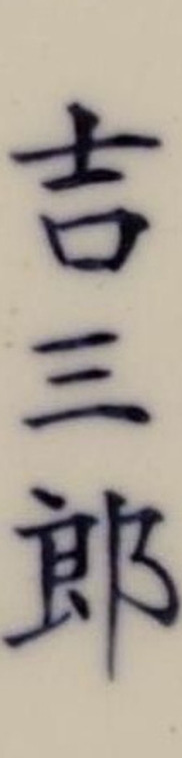吉三郎
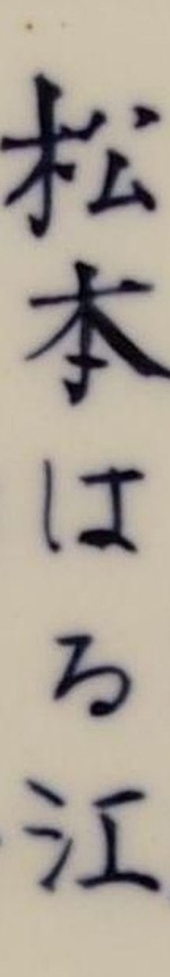松本はる江
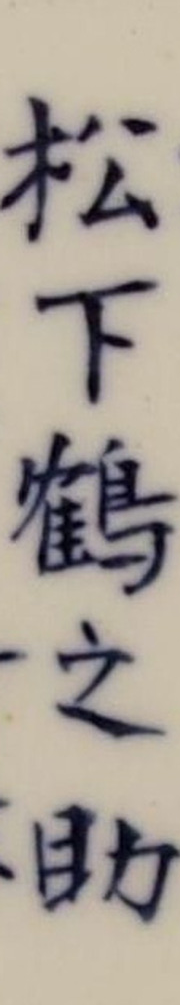松下鶴之助
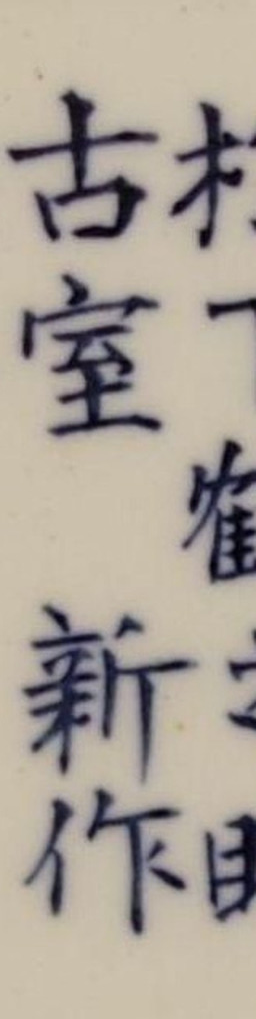古室新作
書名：E~L
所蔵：高野山金剛峯寺
